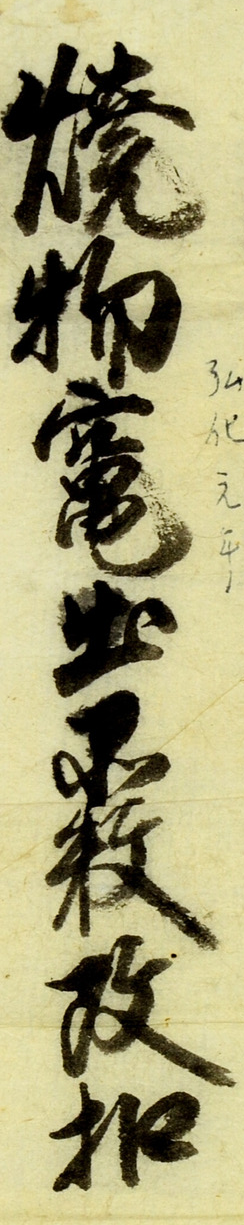焼物竃出品数改扣
